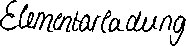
Elementarladung
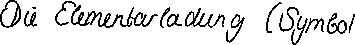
Die Elementarladung (Symbol:
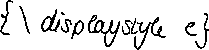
{\displaystyle e}
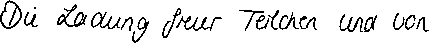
Die Ladung freier Teilchen und von
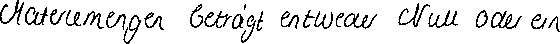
Materiemengen beträgt entweder Null oder ein
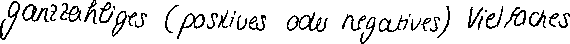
ganzzahliges (positives oder negatives) Vielfaches
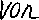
von
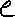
e
